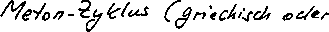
Meton-Zyklus (griechisch oder
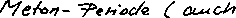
Meton-Periode (auch
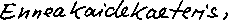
Enneakaidekaeteris,
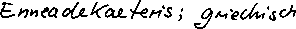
Enneadekaeteris; griechisch
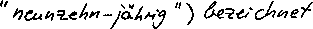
"neunzehn-jährig") bezeichnet
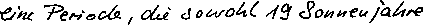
eine Periode, die sowohl 19 Sonnenjahre
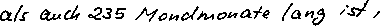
als auch 235 Mondmonate lang ist,
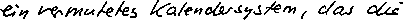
ein vermutetes Kalendersystem, das die
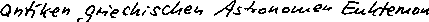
antiken griechischen Astronomen Euktemon
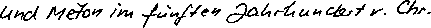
und Meton im fünften Jahrhundert v. Chr.
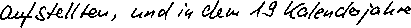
aufstellten, und in dem 19 Kalenderjahre
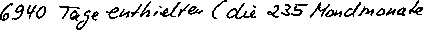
6940 Tage enthielten (die 235 Mondmonate
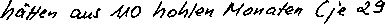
hätten aus 110 hohlen Monaten (je 29
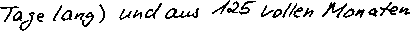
Tage lang) und aus 125 vollen Monaten
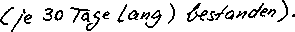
(je 30 Tage lang) bestanden).
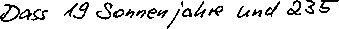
Dass 19 Sonnenjahre und 235
